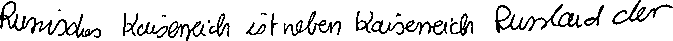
Russisches Kaiserreich ist neben Kaiserreich Russland der
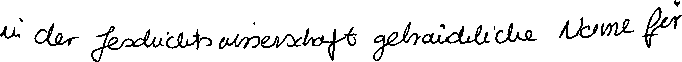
in der Geschichtswissenschaft gebräuchliche Name für
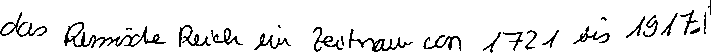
das Russische Reich im Zeitraum von 1721 bis 1917.
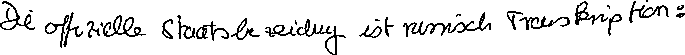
Die offizielle Staatsbezeichnung ist russisch Transkription:
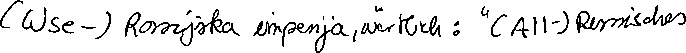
(Wse-)Rossijskaja imperija, wörtlich: "(All-)Russisches
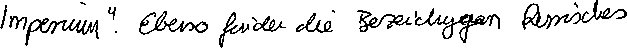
Imperium". Ebenso finden die Bezeichnungen Russisches
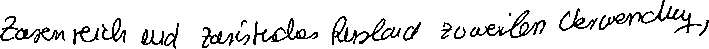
Zarenreich und zaristisches Russland zuweilen Verwendung,
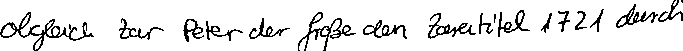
obgleich Zar Peter der Große den Zarentitel 1721 durch
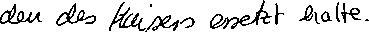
den des Kaisers ersetzt hatte.
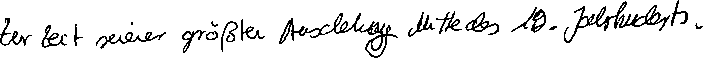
Zur Zeit seiner größten Ausdehnung Mitte des 19. Jahrhunderts
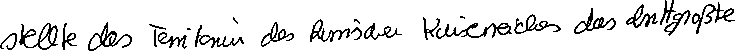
stellte das Territorium des Russischen Kaiserreichs das drittgrößte
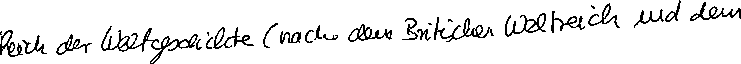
Reich der Weltgeschichte (nach dem Britischen Weltreich und dem
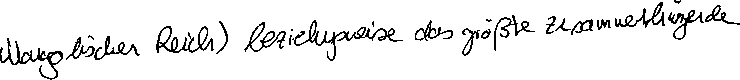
Mongolischen Reich) beziehungsweise das größte zusammenhängende
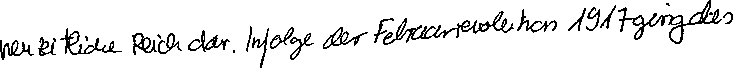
neuzeitliche Reich dar. Infolge der Februarrevolution 1917 ging das
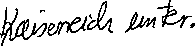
Kaiserreich unter.
